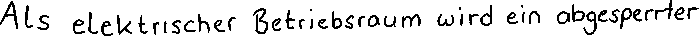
Als elektrischer Betriebsraum wird ein abgesperrter
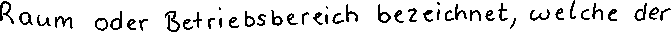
Raum oder Betriebsbereich bezeichnet, welche der
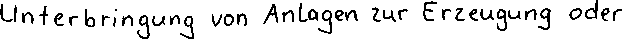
Unterbringung von Anlagen zur Erzeugung oder
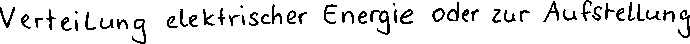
Verteilung elektrischer Energie oder zur Aufstellung
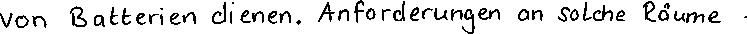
von Batterien dienen. Anforderungen an solche Räume
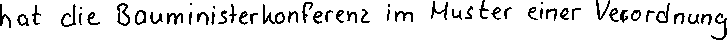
hat die Bauministerkonferenz im Muster einer Verordnung
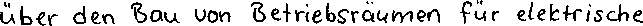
über den Bau von Betriebsräumen für elektrische
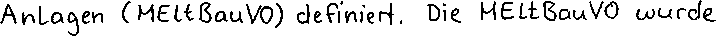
Anlagen (MEltBauVO) definiert. Die MEltBauVO wurde
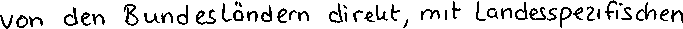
von den Bundesländern direkt, mit landesspezifischen
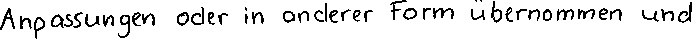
Anpassungen oder in anderer Form übernommen und
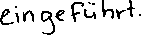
eingeführt.
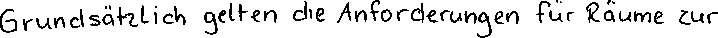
Grundsätzlich gelten die Anforderungen für Räume zur
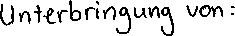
Unterbringung von:
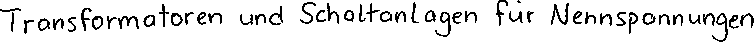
Transformatoren und Schaltanlagen für Nennspannungen
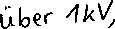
über 1 kV,
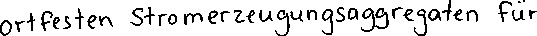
ortsfesten Stromerzeugungsaggregaten für
